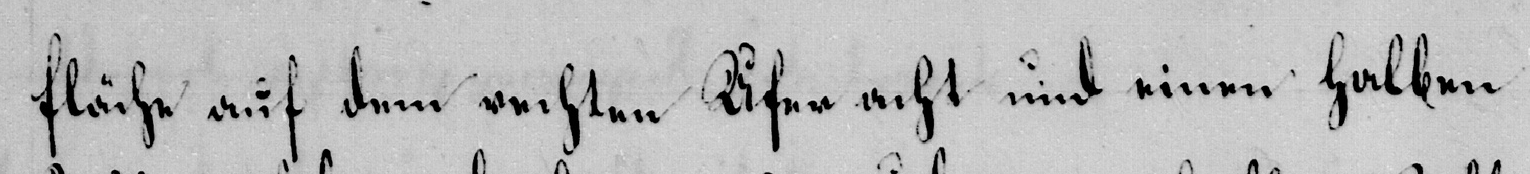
fläche auf dem rechten Ufer acht und einen halben
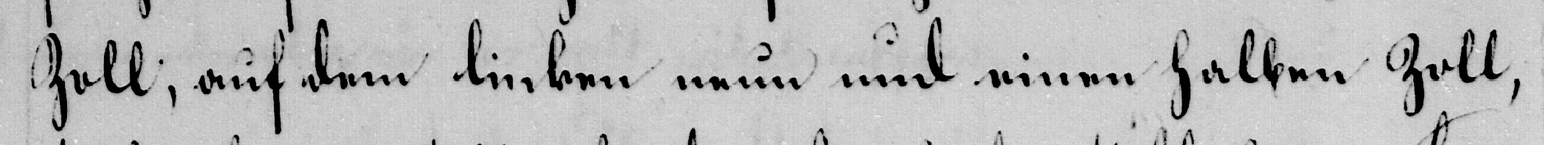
Zoll, auf dem linken neun und einen halben Zoll,
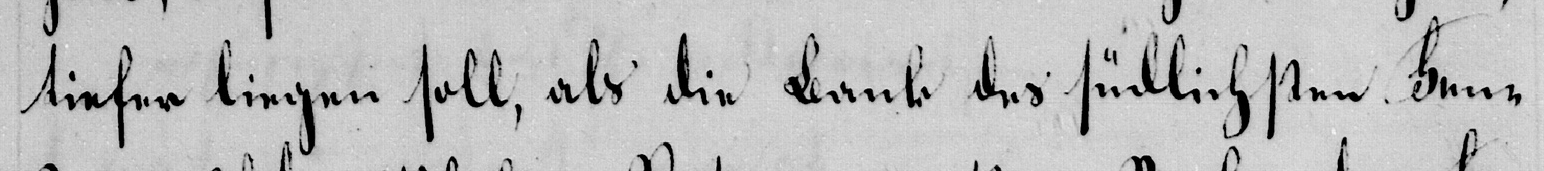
tiefer liegen soll, als die Bank des südlichsten Fens¬
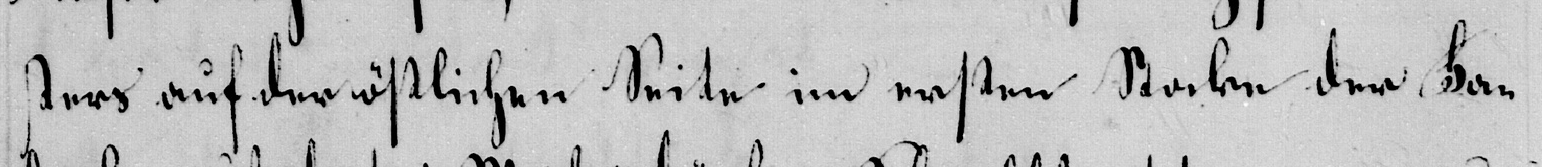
ters auf der östlichen Seite im ersten Stocke der Fa¬
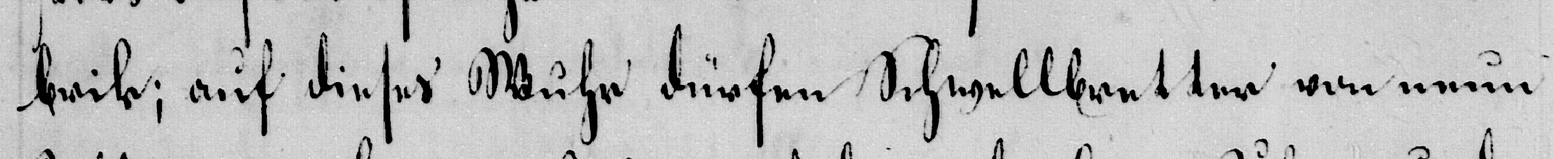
brik; auf dieses Wuhr dürfen Schwellbretter von neun
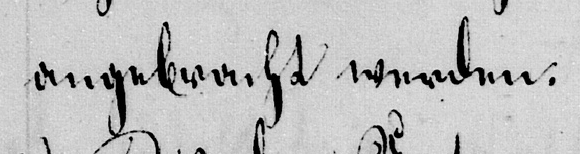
angebracht werden.
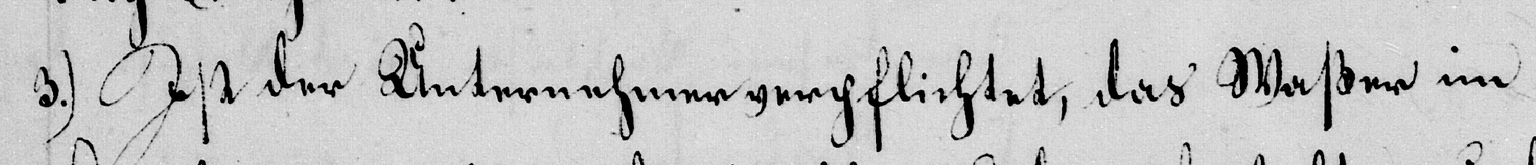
3.) Ist der Unternehmer verpflichtet, das Waßer im
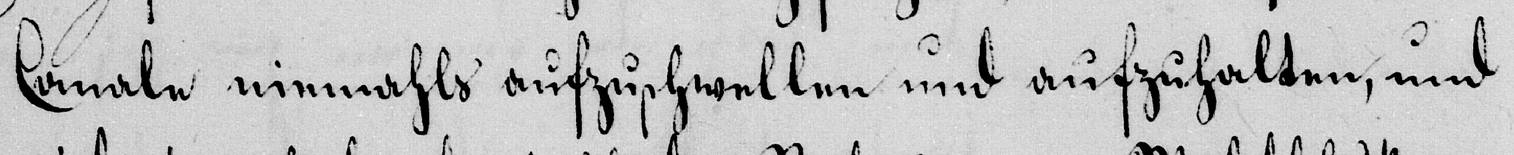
Canale niehmals aufzuschwellen und aufzuhalten, und
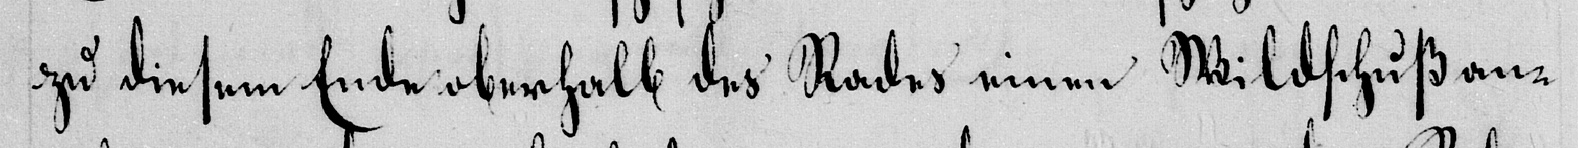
zu diesem Ende oberhalb des Rades einen Wildschuß an¬
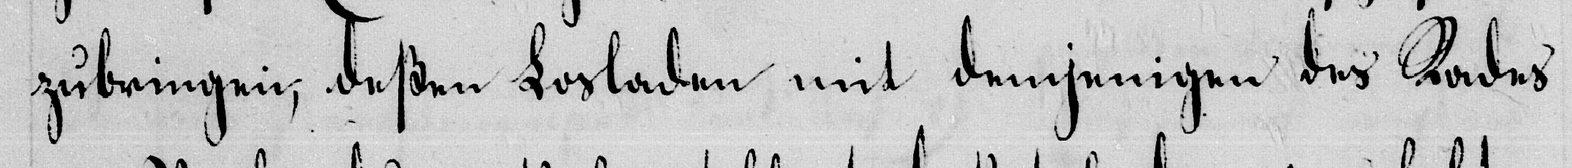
zubringen, deßen Losladen mit demjenigen des Rades
